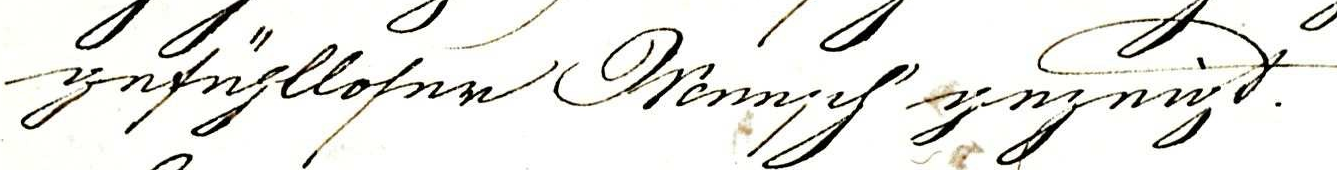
gefühlloser Mensch gezeigt.
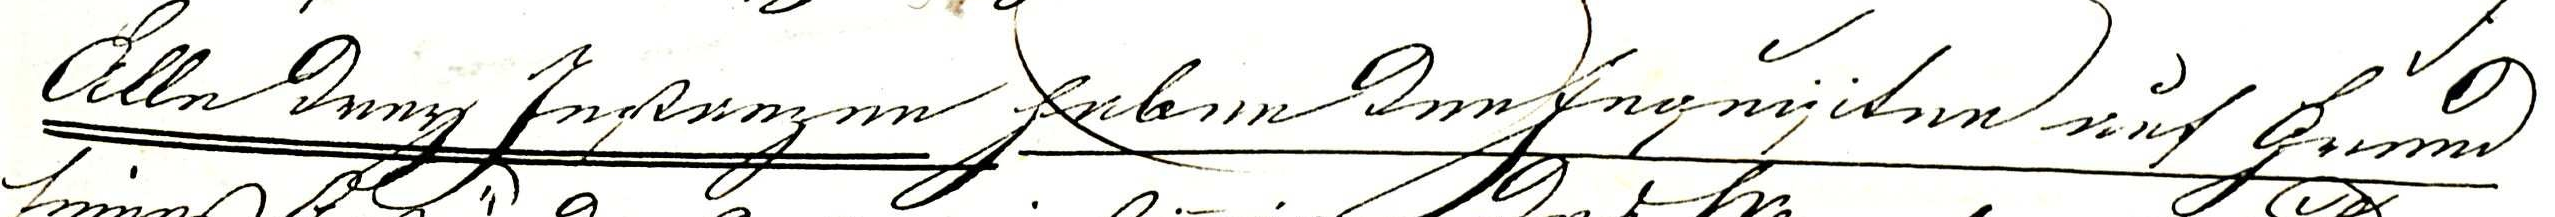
Alle drey Instanzen haben der Inquisiten auf Grund
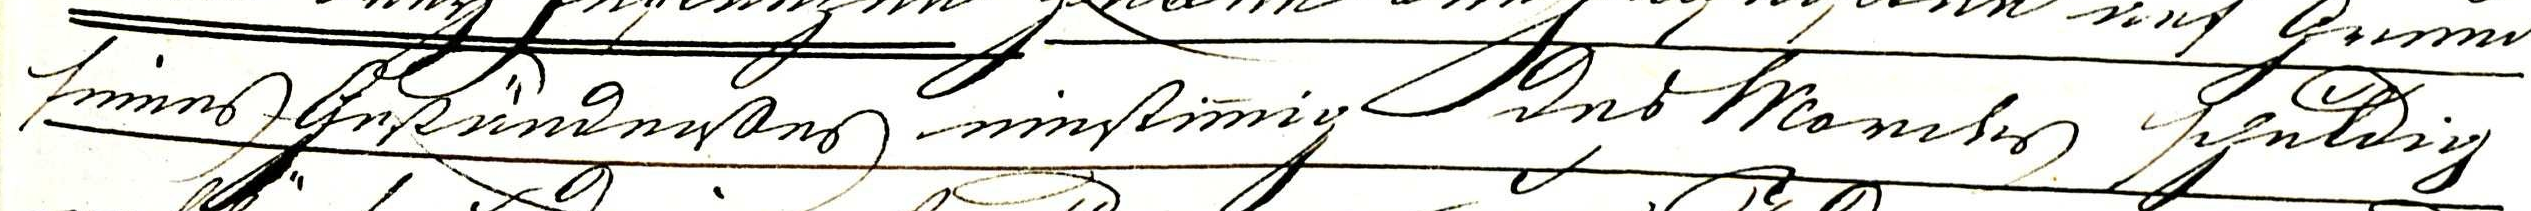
seines Geständnißes einstimmig des mOrdes schuldig
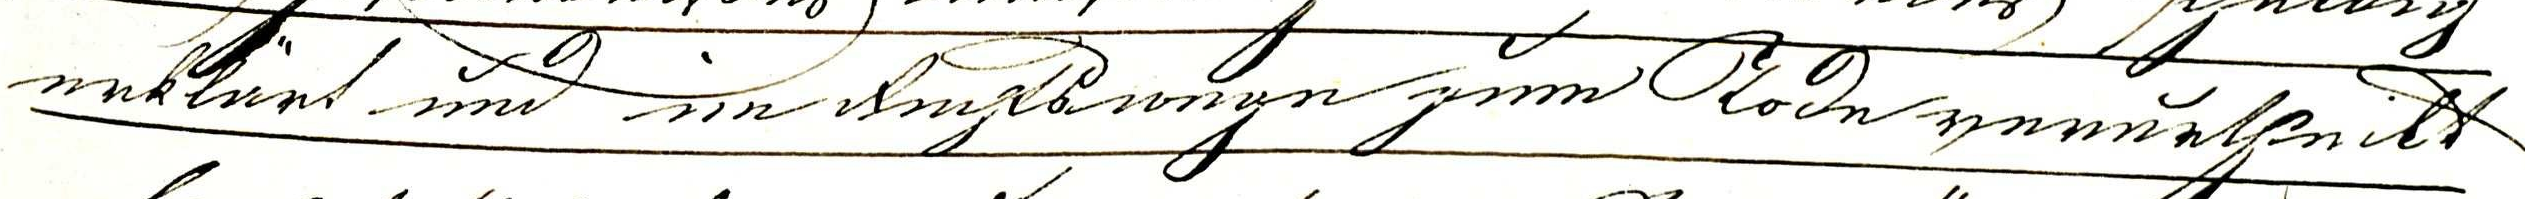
erklärt und im Rechtswege zum Tode verurtheilt.
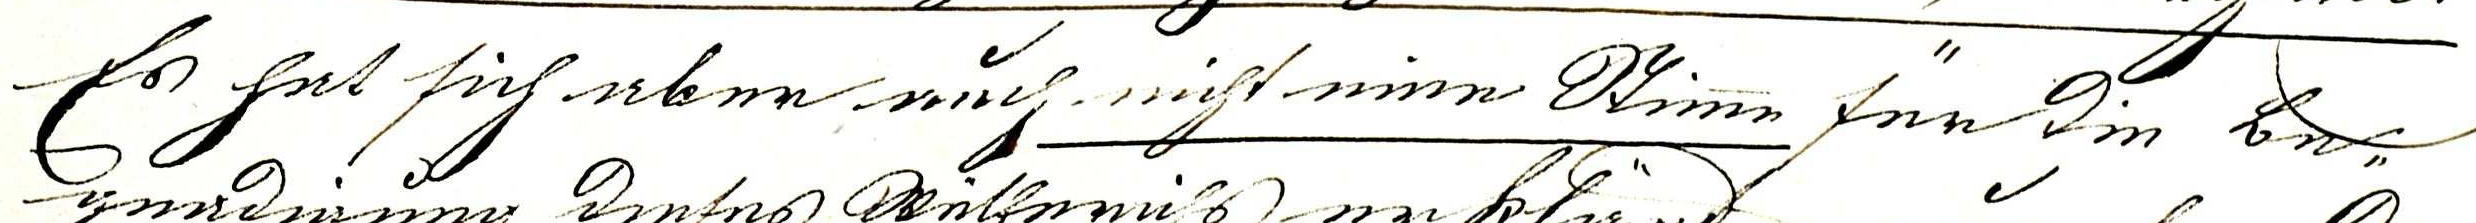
Es hat sich aber auch nicht eine Stimme für die Be¬
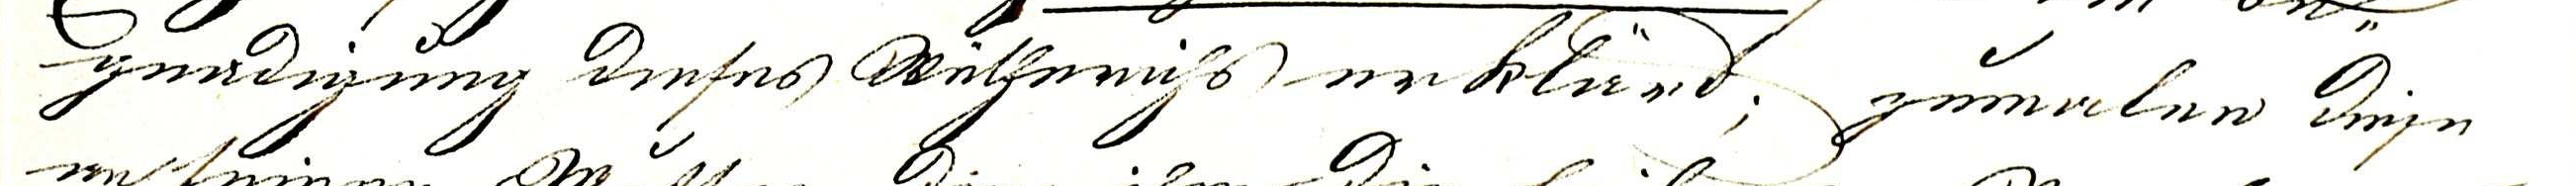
gnadigung dieses Wütherichs [Wüterich] erklärt; zumalen diese
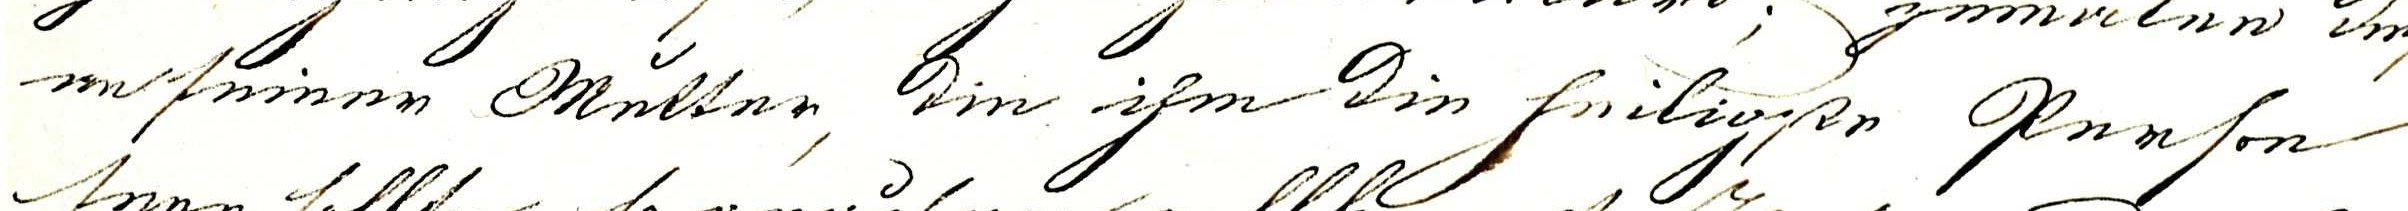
an seiner Mutter, die ihm die heiligste Person
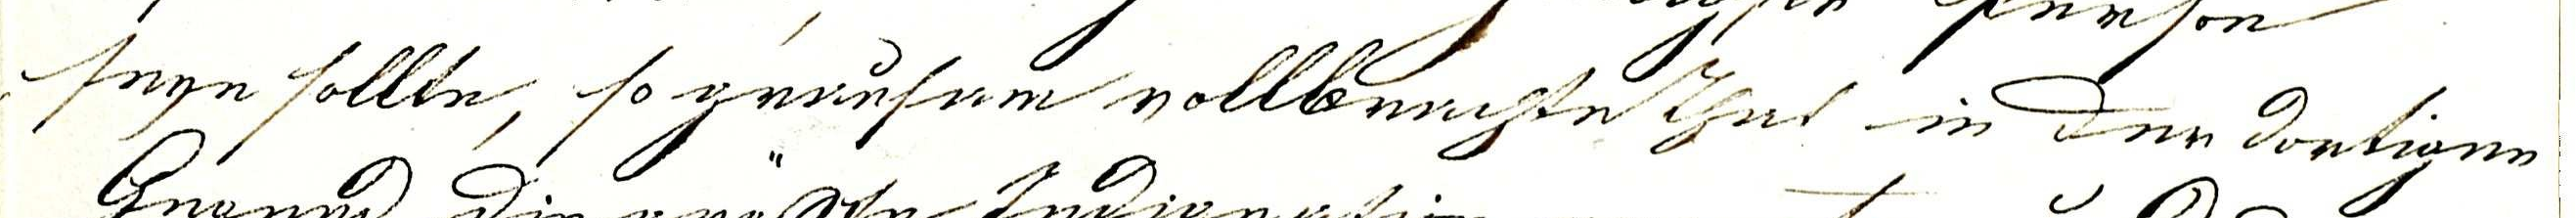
seyn sollte, so grausam vollbrachte That in der dortigen
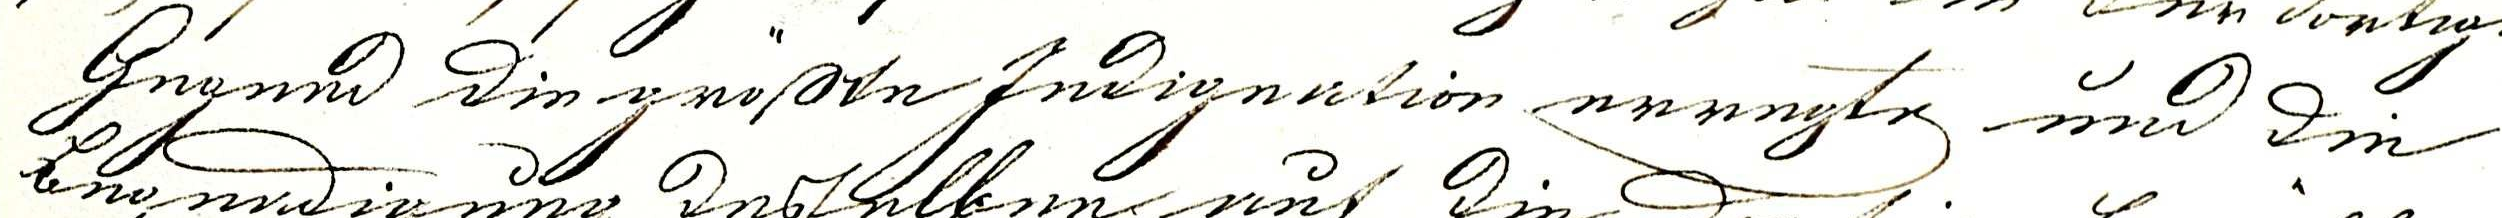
Gegend die größte Indignation erregte und die
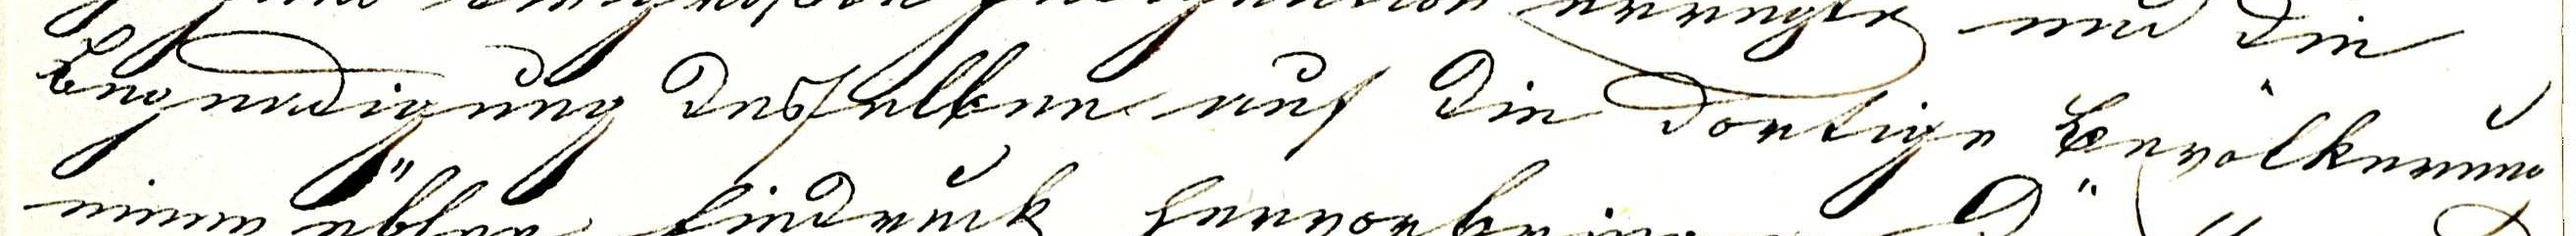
Begnadigung desselben auf die dortige Bevölkerung
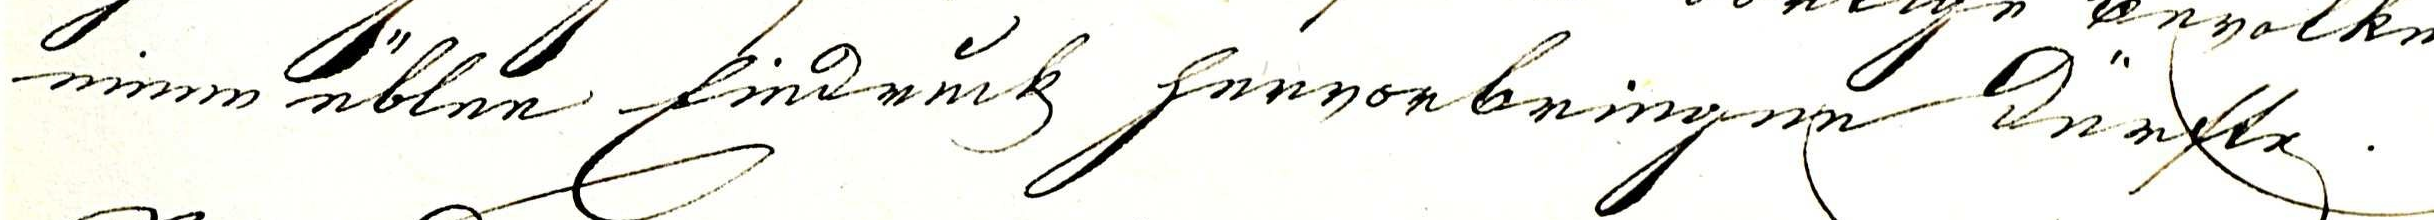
einen üblen Eindruck hervorbringen dürfte.
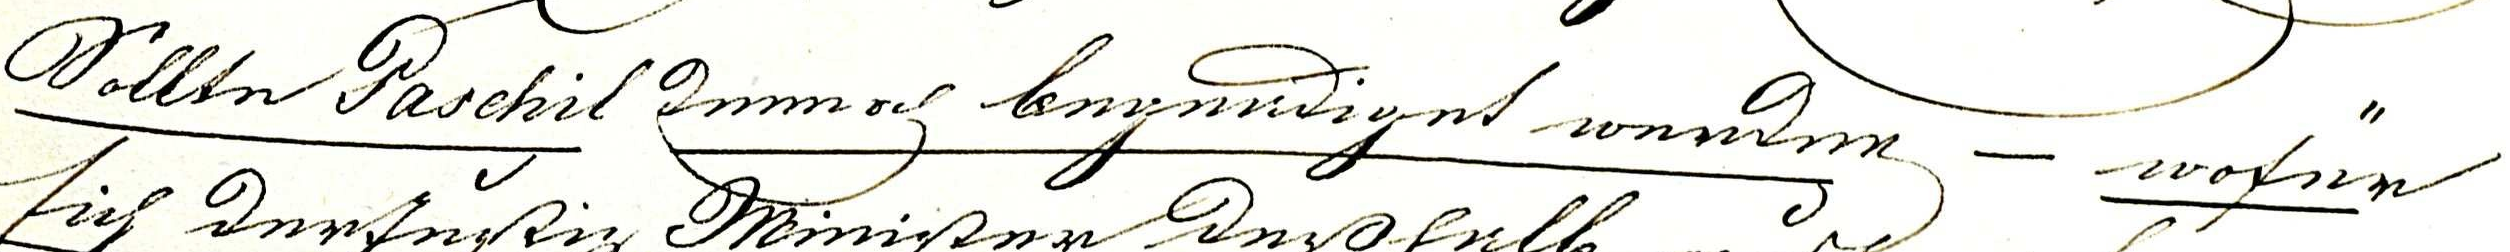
Sollte Paschil demnoch begandiget werden – wofür
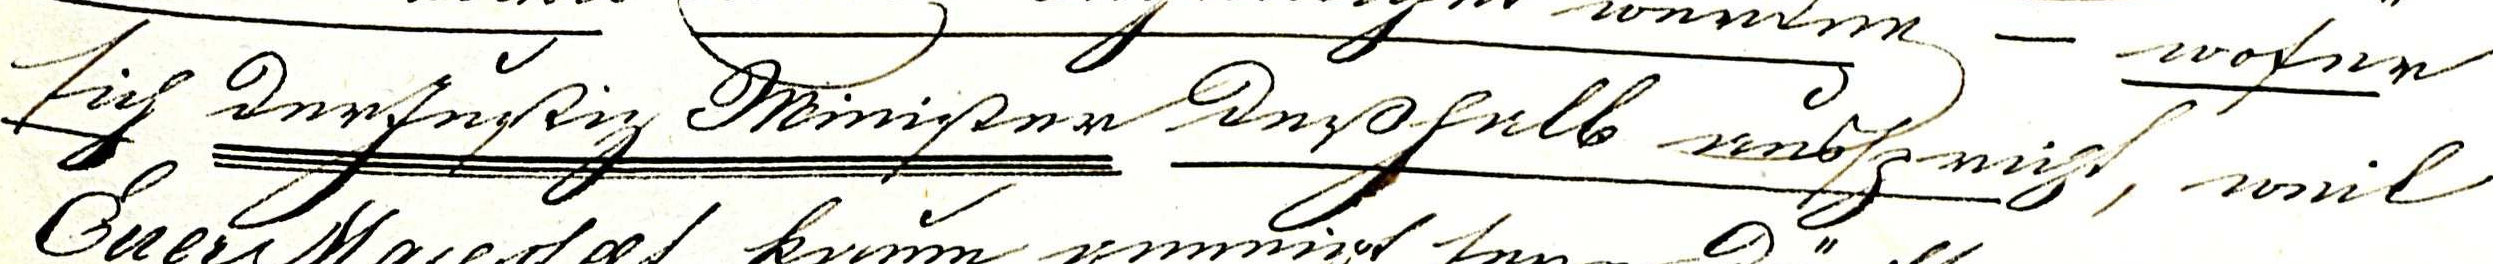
sich der Justiz Minister deßhalb ausspricht, weil
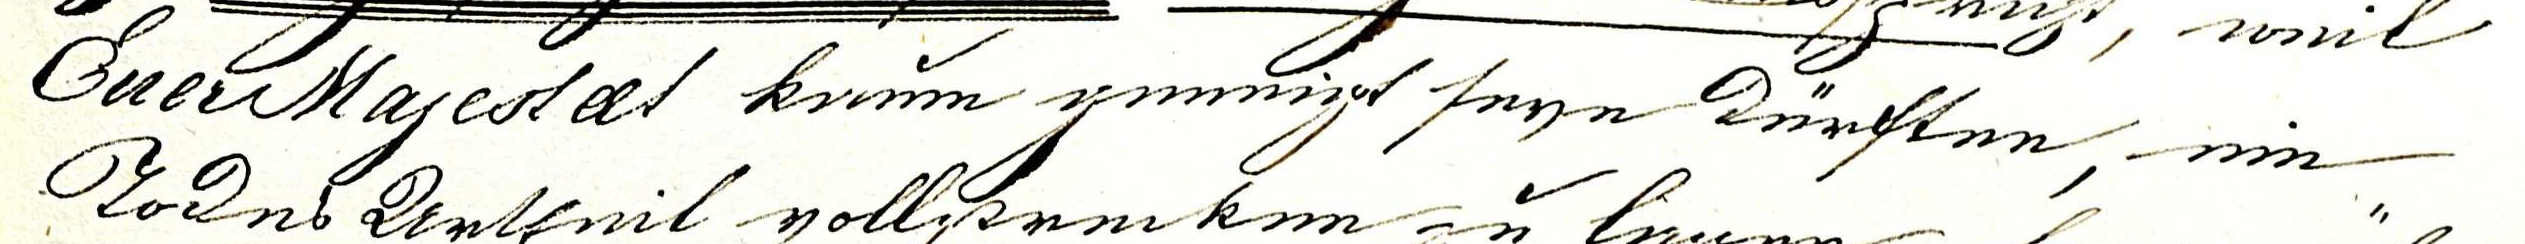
Euer Majestaet kaum geneigt seyn dürften, ein
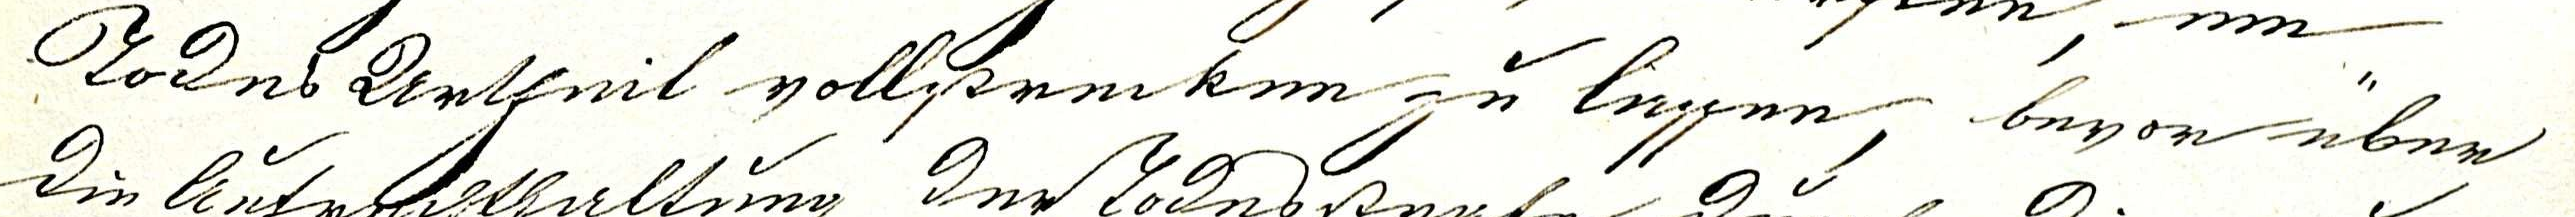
Todes Urtheil vollstrecken zu lassen, bevor über
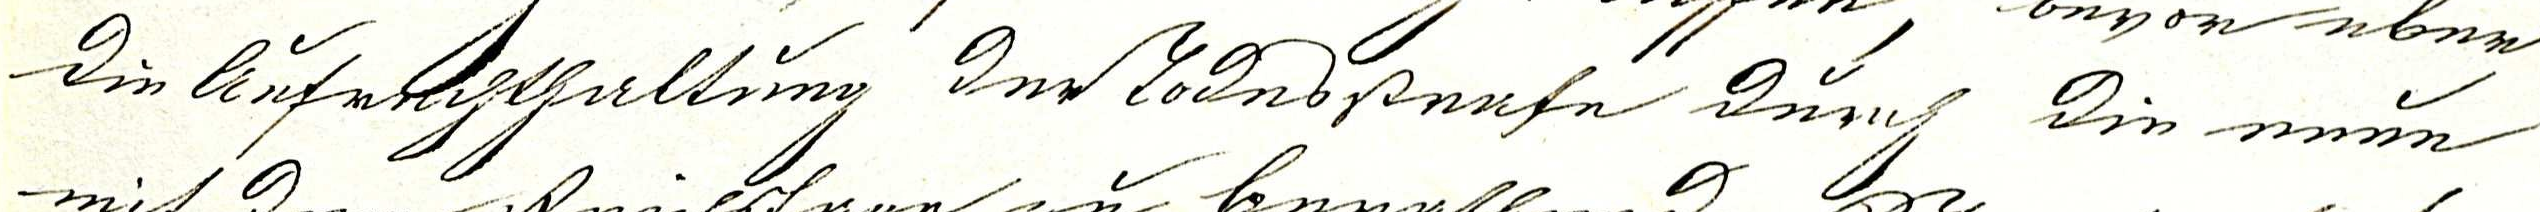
die Aufrechthaltung der Todesstrafe durch die neuen
